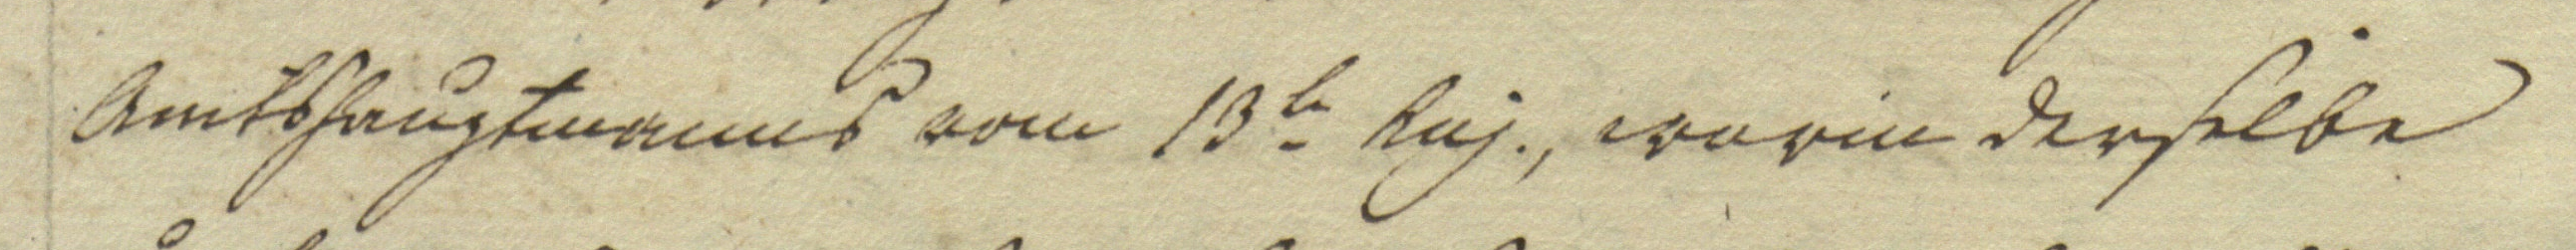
Amtshauptmanns vom 13 t huj., worin derselbe
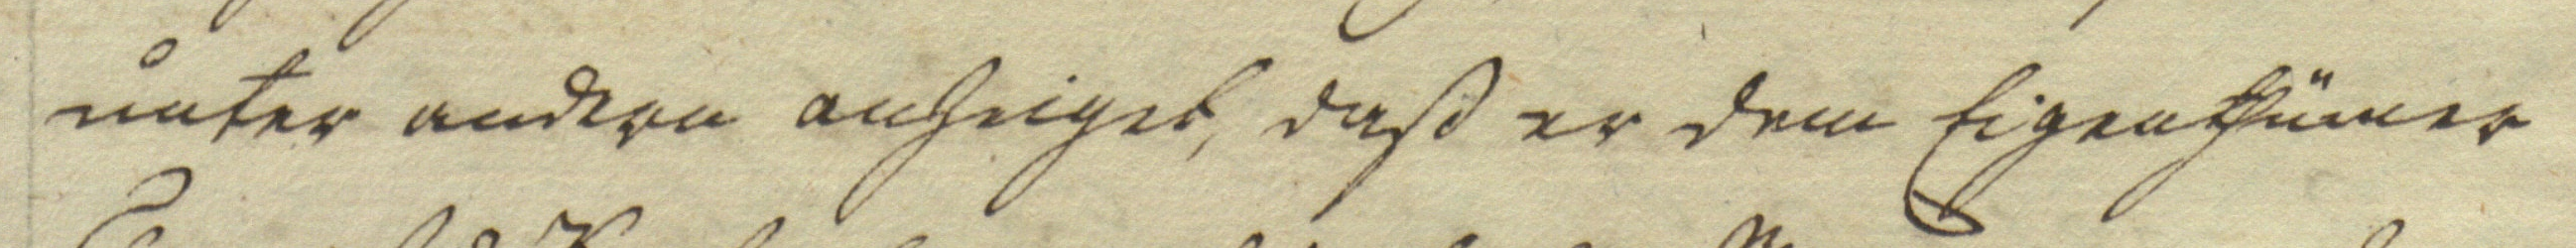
unter andern anzeiget, daß er dem Eigenthümer
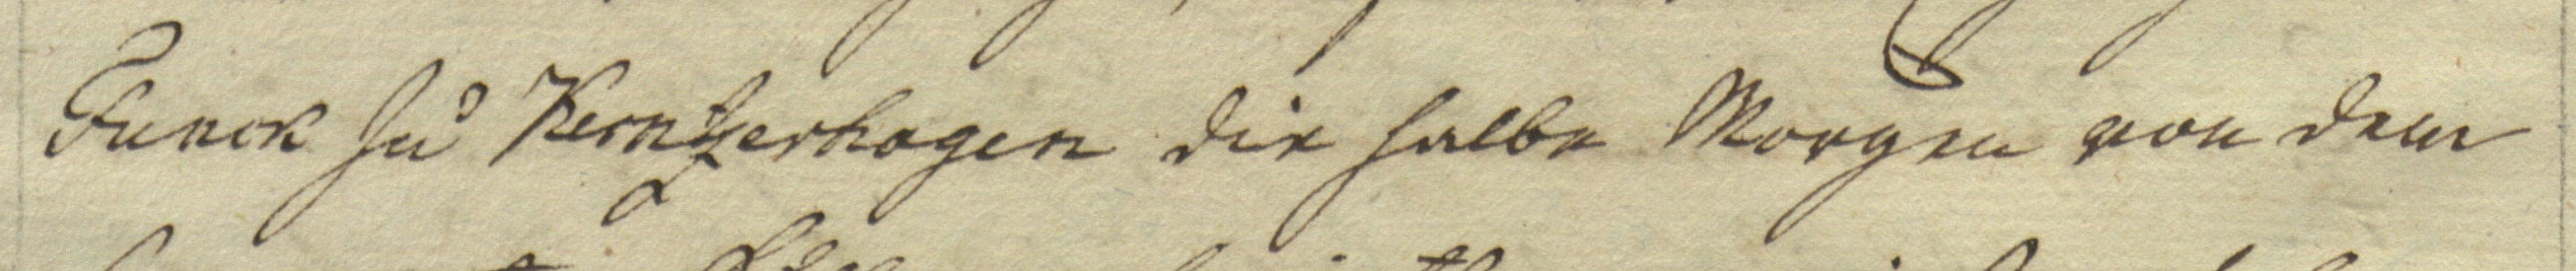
Funck zu Kemtzerhagen die halbe Morgen von dem
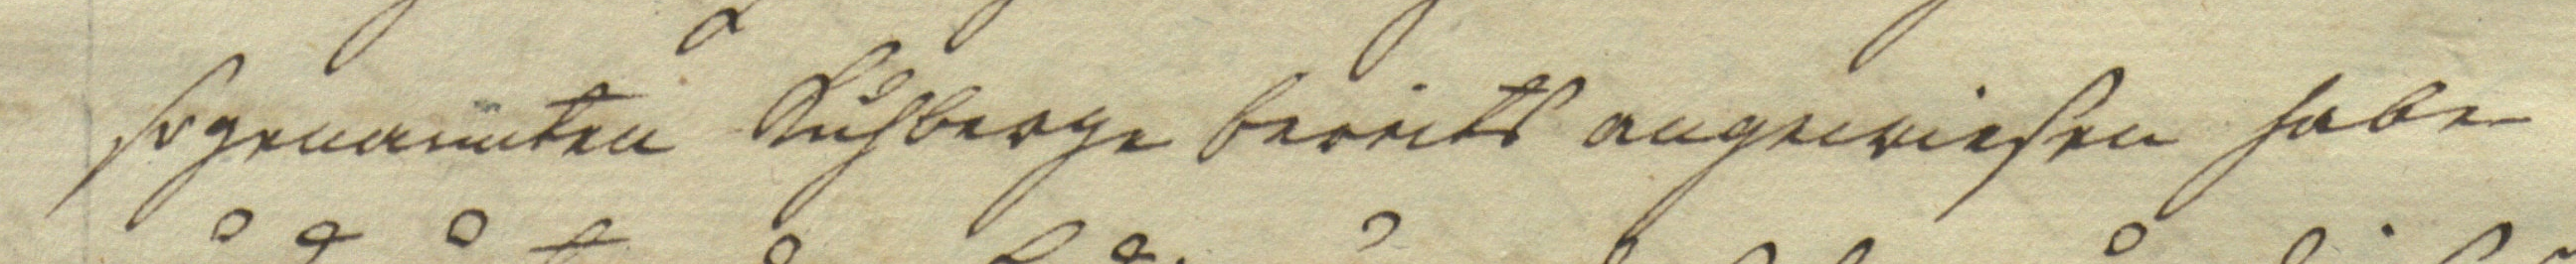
sogenannten Kuhberge bereits angewiesen habe
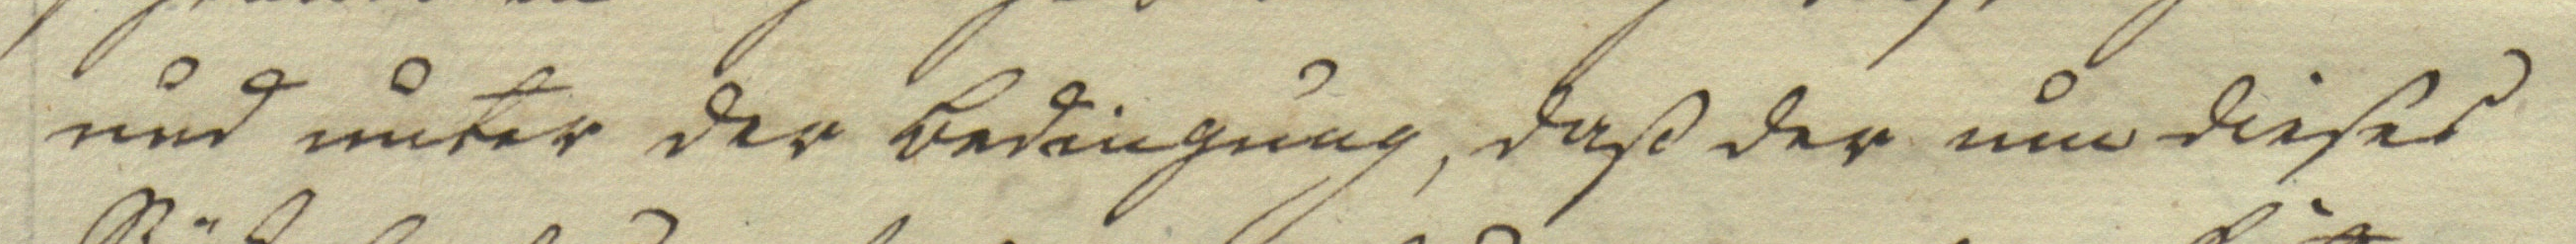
und unter der Bedingung, daß der um dieses
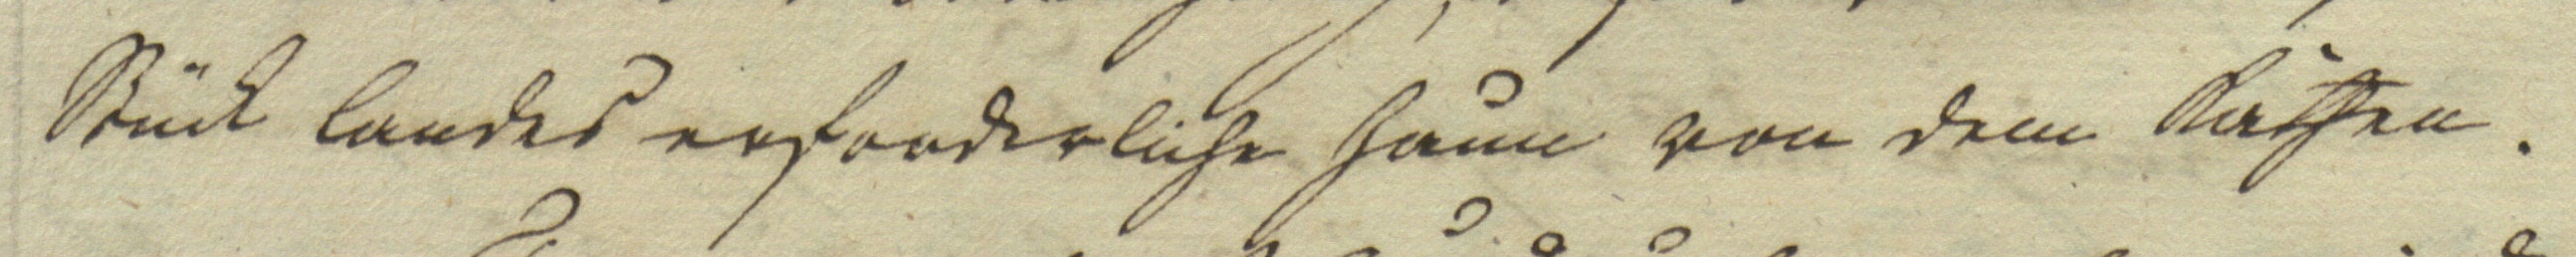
Stück Landes erforderliche Zaun von dem Kathen¬
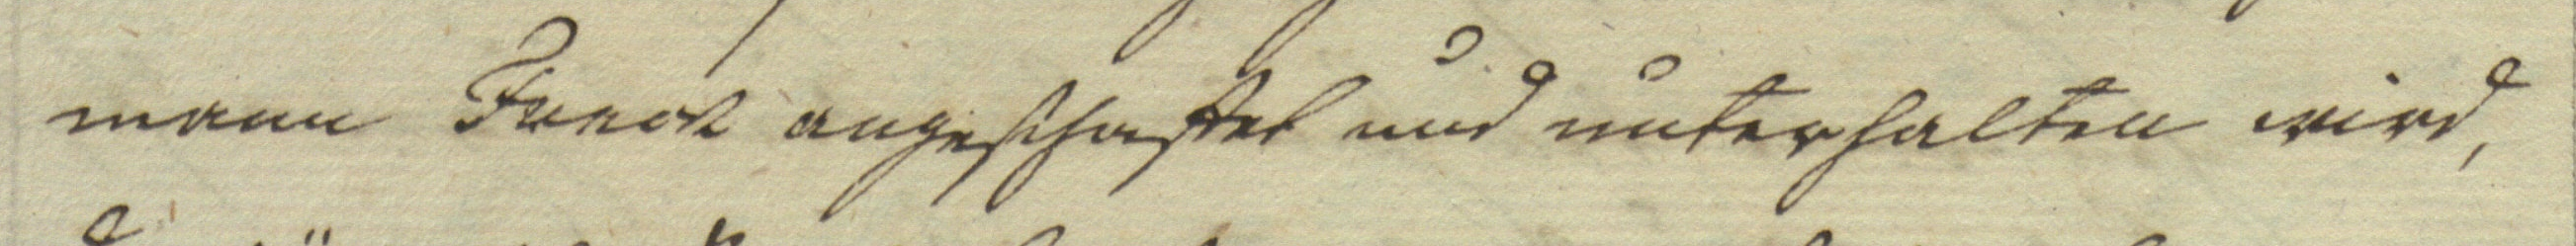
mann Funck angeschaffet und unterhalten wird,
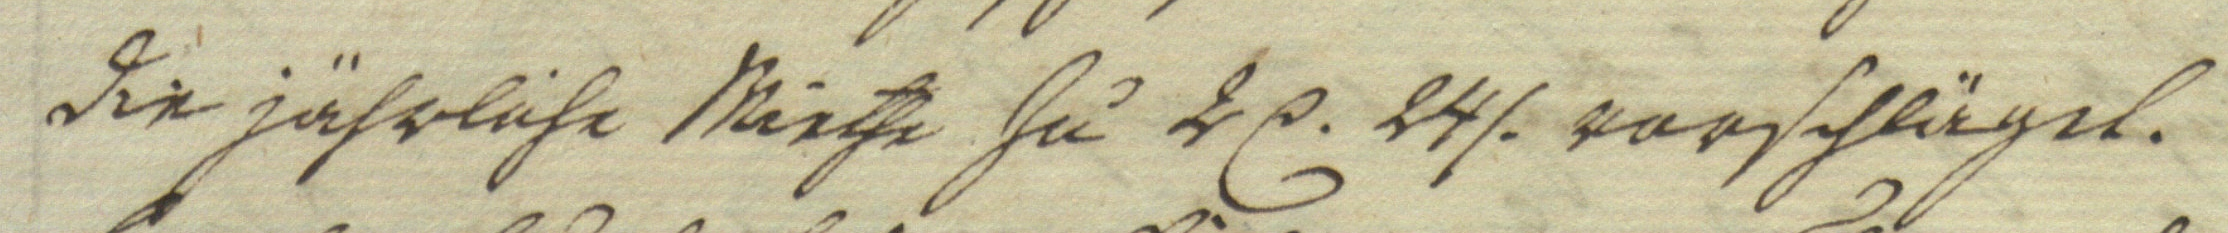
die jährliche Miethe zu 2 l. 24 s. vorschläget.
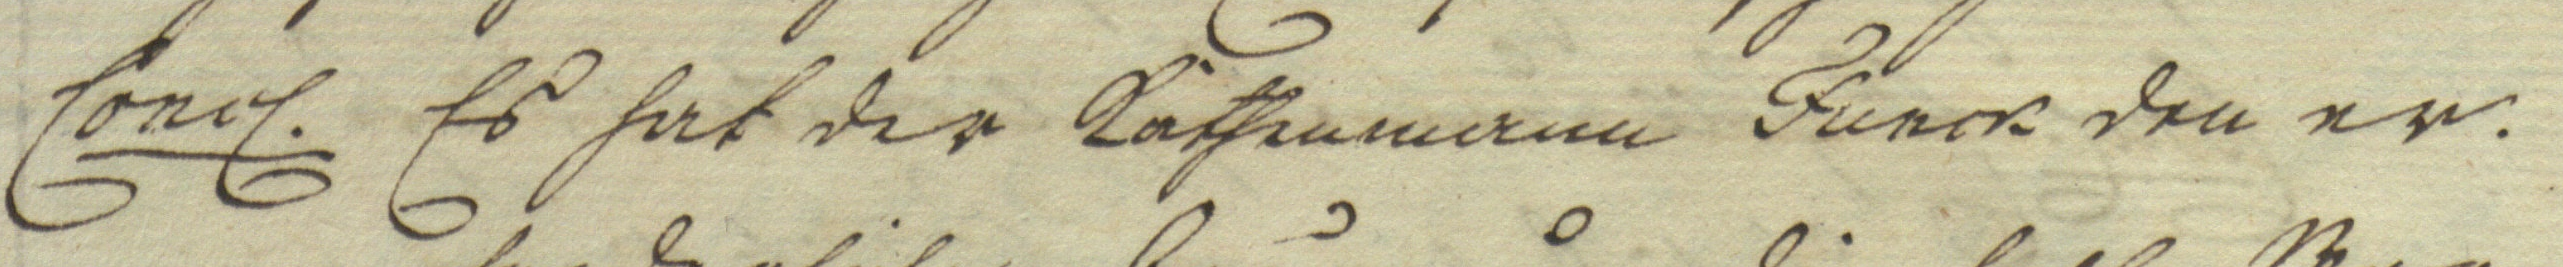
Concl. Es hat der Kathenmann Funck den er¬
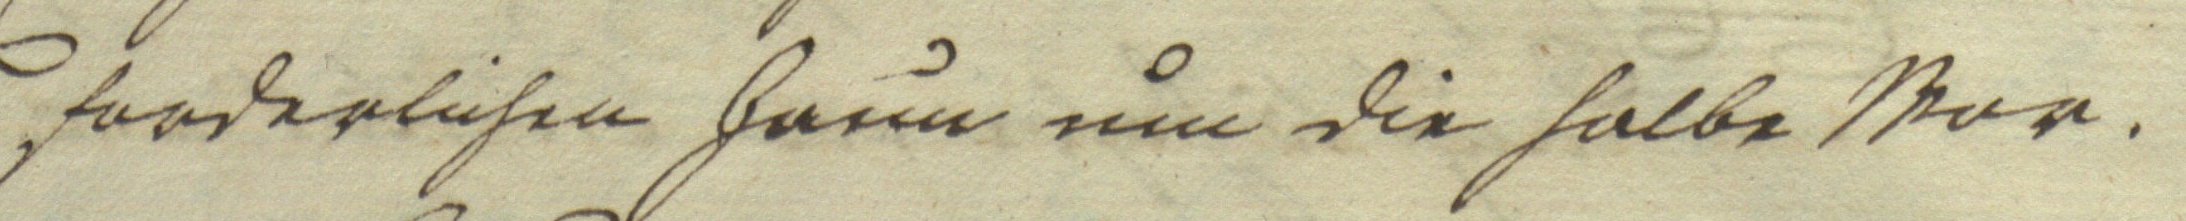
forderlichen Zaun um die halbe Mor¬
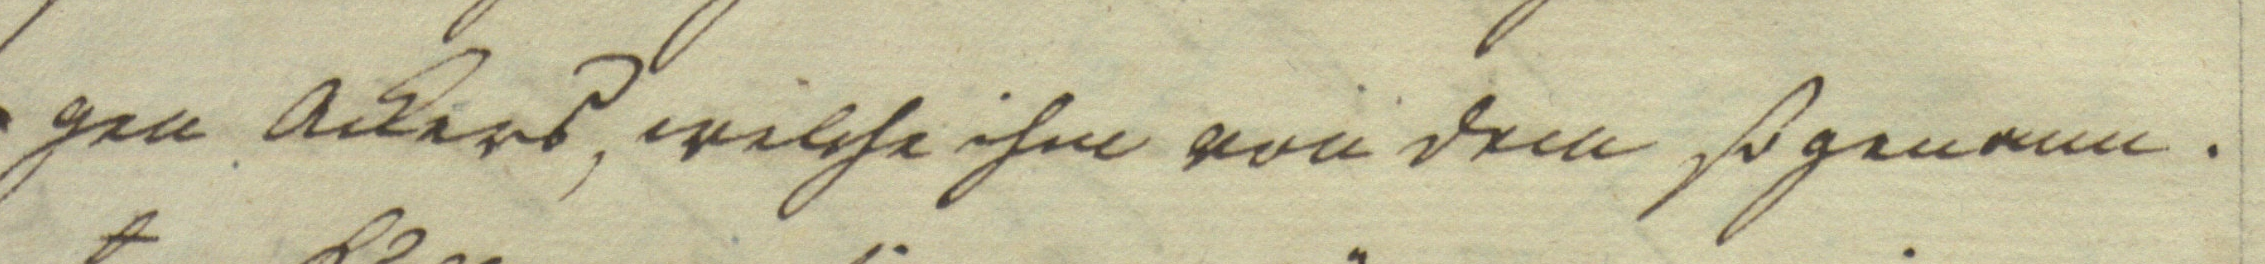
gen Ackers, welche ihm von dem sogenann¬
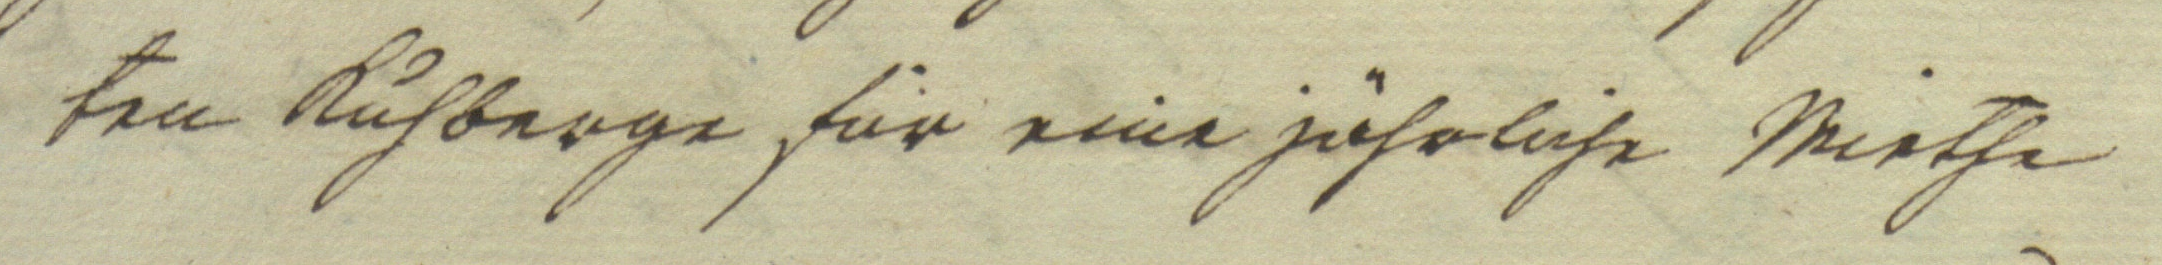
ten Kuhberge für eine jährliche Miethe
